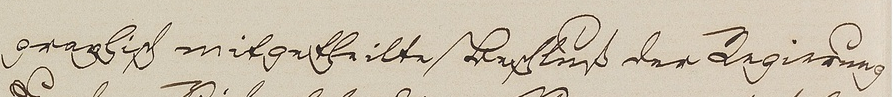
graphisch mitgetheilte Beschluß der Regierung
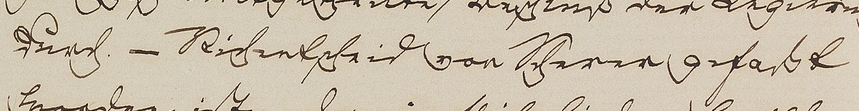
durch – Stichentscheid von Scherer gefaßt
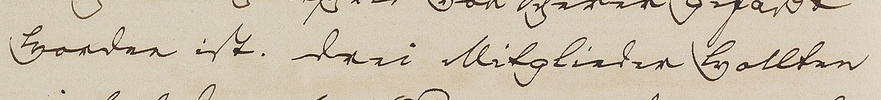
worden ist. Drei Mitglieder wollten
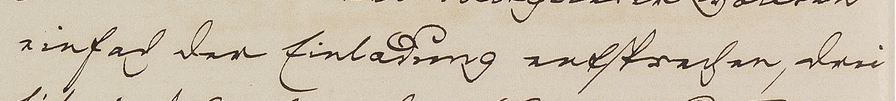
einfach der Einladung entsprechen, drei
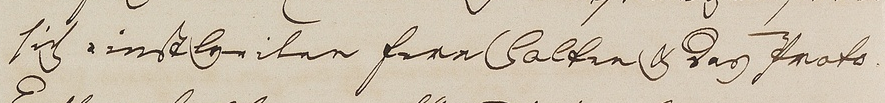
sich einstweilen fern halten & das Proto-
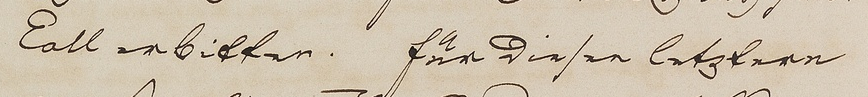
koll erbitten. Für diesen letztern
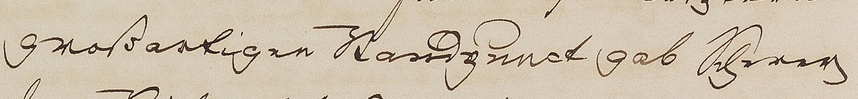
großartigen Standpunct gab Scherer
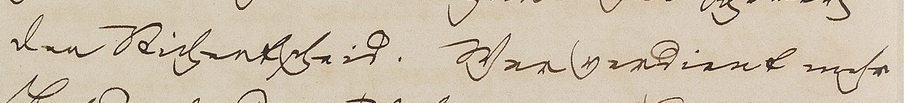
den Stichentscheid. Wer verdient mehr
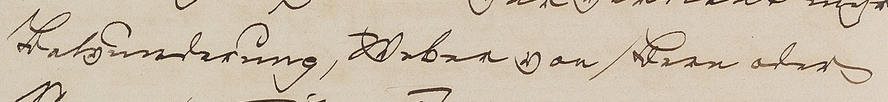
Bewunderung, Weber von Bern oder
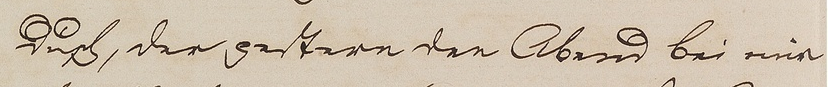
Dusch, der gestern den Abend bei mir
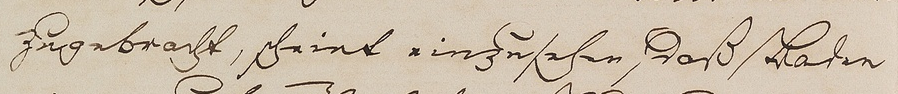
zugebracht, scheint einzusehen, daß Baden
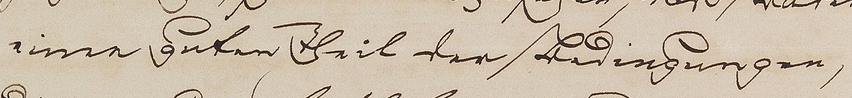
einen guten Theil der Bedingungen,
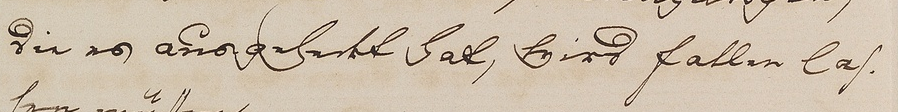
die es ausgeheckt hat, wird fallen las-
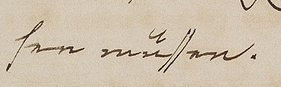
sen müssen.
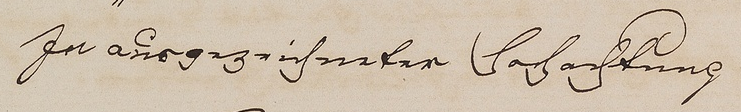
In ausgezeichneter Hochachtung
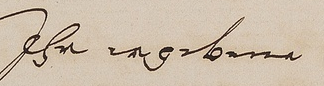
Ihr ergebener
